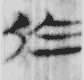於
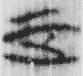正
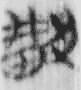荊（荆）
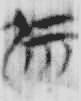𫵖
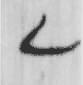乙
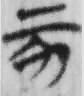亥
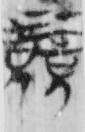競
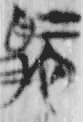馳
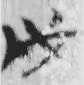戊
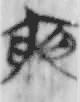寅
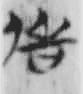俈
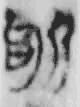斪
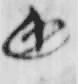臣
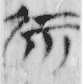𫵖
